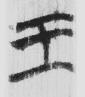王
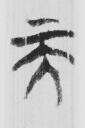天
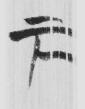下
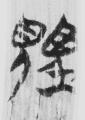{見垔}
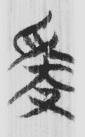爯
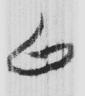㠯（以）
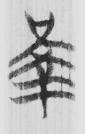{口㚔}
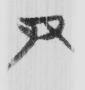四
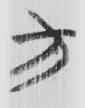方
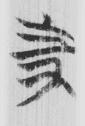寺
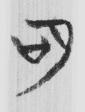名
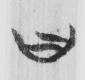曰
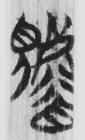{見睿}
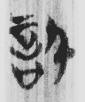信
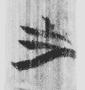之
